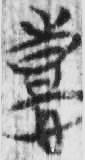憙（喜）
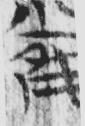雀（爵）
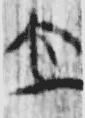立（位）
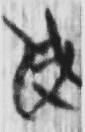凡
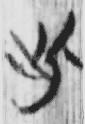此
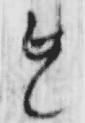也
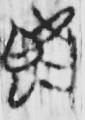既
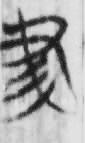○（盡）
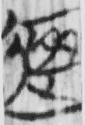迻
